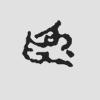爲
